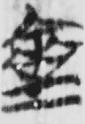齊
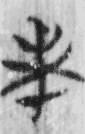未
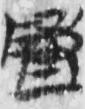○（陳）
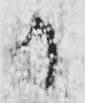人
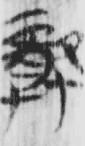龔
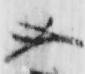之
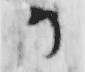人
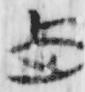上
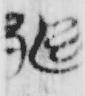○（弦）
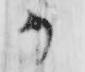人
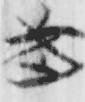武
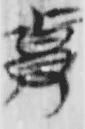貴
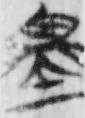墨
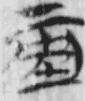坪
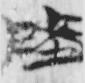陵
